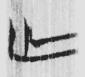亡
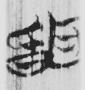䎽
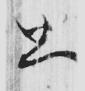也
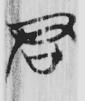君
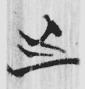之
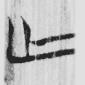亡
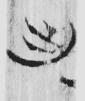出
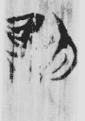則
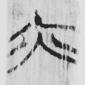亦
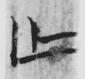亡
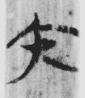內
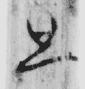也
